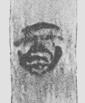百
